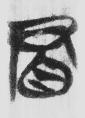冒
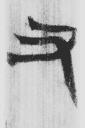又
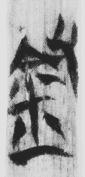{金父}
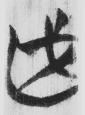戉
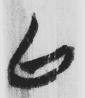㠯（以）
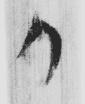人
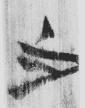之
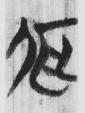佴
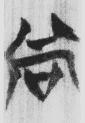尚
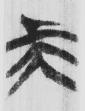天
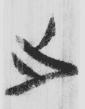之
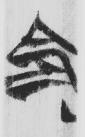命
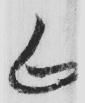㠯（以）
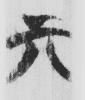亓
